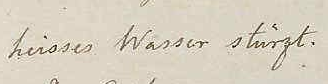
heisses Wasser stürzt.
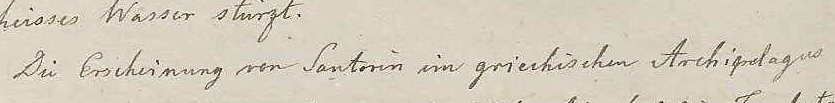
Die Erscheinung von Santorin im griechischen Archipelagus
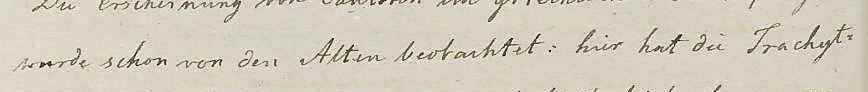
wurde schon von den Alten beobachtet: hier hat die Trachyt-
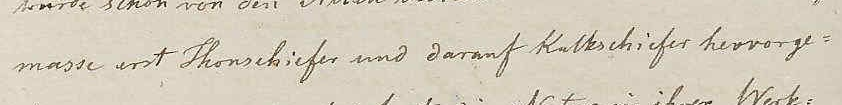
masse erst Thonschiefer und darauf Kalkschiefer hervorge-
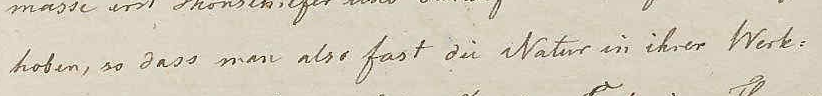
hoben, so dass man also fast die Natur in ihrer Werk-
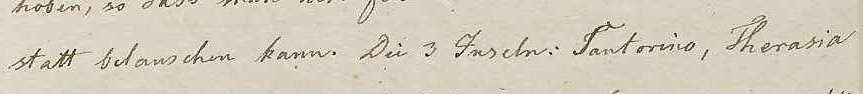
statt belauschen kann. Die 3 Inseln: TSantorino, Therasia
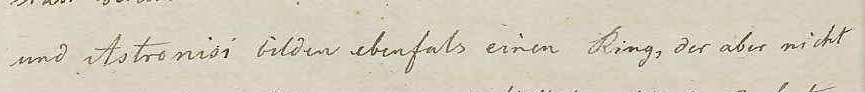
und Astronisi bilden ebenfals einen Ring, der aber nicht
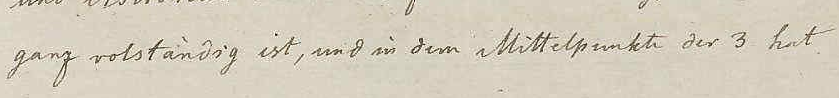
ganz volständig ist, und in dem Mittelpunkte der 3 hat
